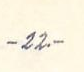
22
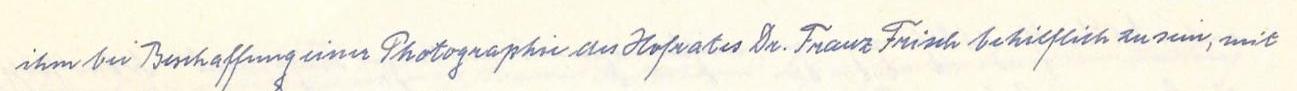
ihm bei der Beschaffung einer Photographie des Hofrat Dr. Franz Frisch behilflich zu sein, mit
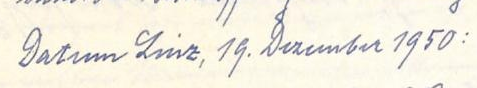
Datum Linz, 19. Dezember 1950:
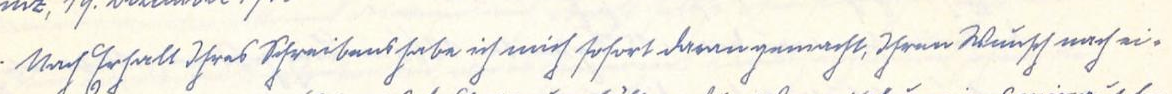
… Nach Erhalt ihres Schreibens habe ich mich sofort daran gemacht, Ihre Wunsch nach ein-
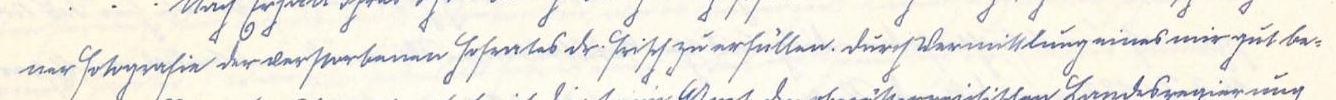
er Fotografie der verstorbenen Hofrat Dr. Frisch zu erfüllen. Durch Vermittlung eines mir gut be-
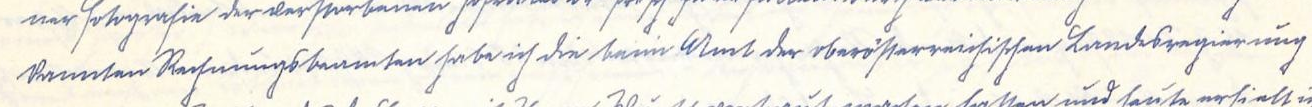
kannten Rechnungsbeamten habe ich die beim Amt der oberösterreichischen Landesregierung
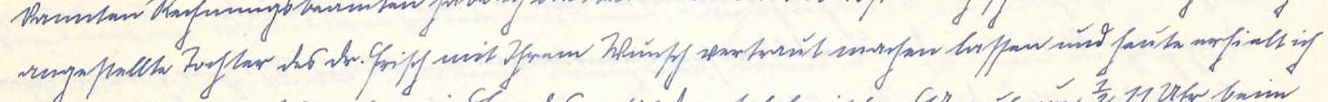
angestellte Tochter des Dr. Frisch mit Ihren Wunsch vertraut machen lassen. Heute erhielt ich
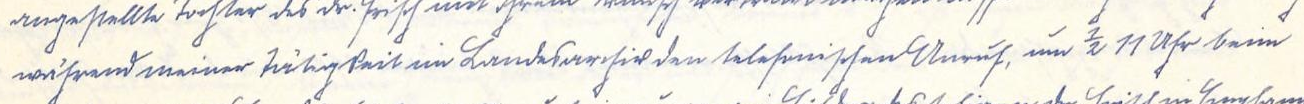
während meiner Tätigkeit im Landesarchiv den telefonischen Anruf, um 1/2 11 Uhr beim
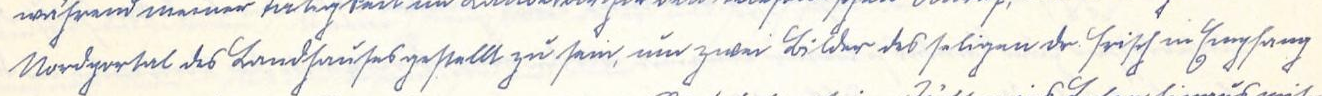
Nordportal des Landhauses gestellt zu sein, um zwei Bilder des seligen Dr. Frisch in Empfang
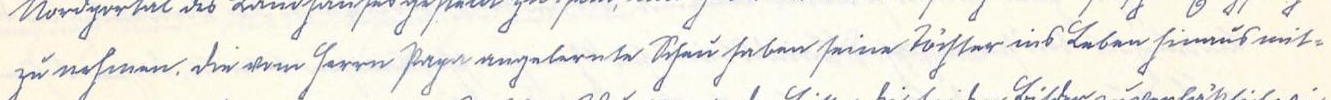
zu nehmen. Die vom Herrn Papa angelernte Schau haben seine Töchter ins Leben hinaus mit-
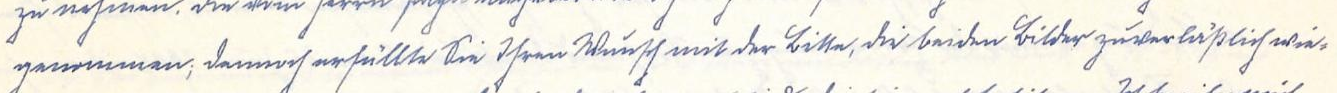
genommen, dennoch erfüllte sie Ihren Wunsch mit der Bitte, die beiden Bilder zuverläßlich wie-
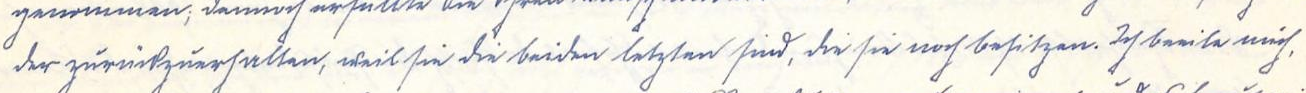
der zurückzuerhalten, weil sie die beiden letzten sind, die sie noch besitzen. Ich beeile mich,
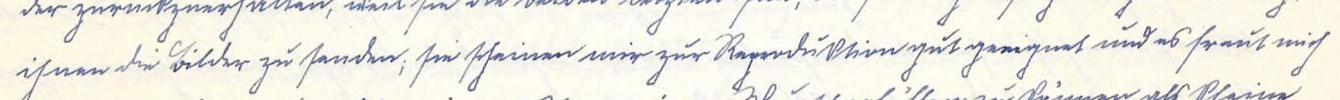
Ihnen die Bilder zu senden. Sie scheinen mehr zur Reproduktion gut geeignet und es freut mich
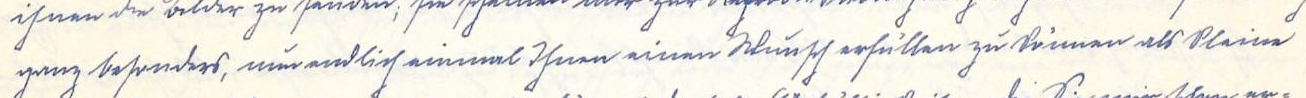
ganz besonders, nun endlich einmal ihnen einen Wunsch erfüllen zu können als kleine
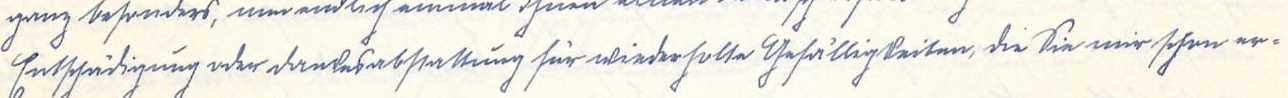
Entschädigung oder Dankesabstattung für wiederholte Gefälligkeiten, die Sie mir schon er-
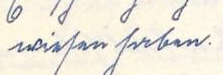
wiesen haben.
